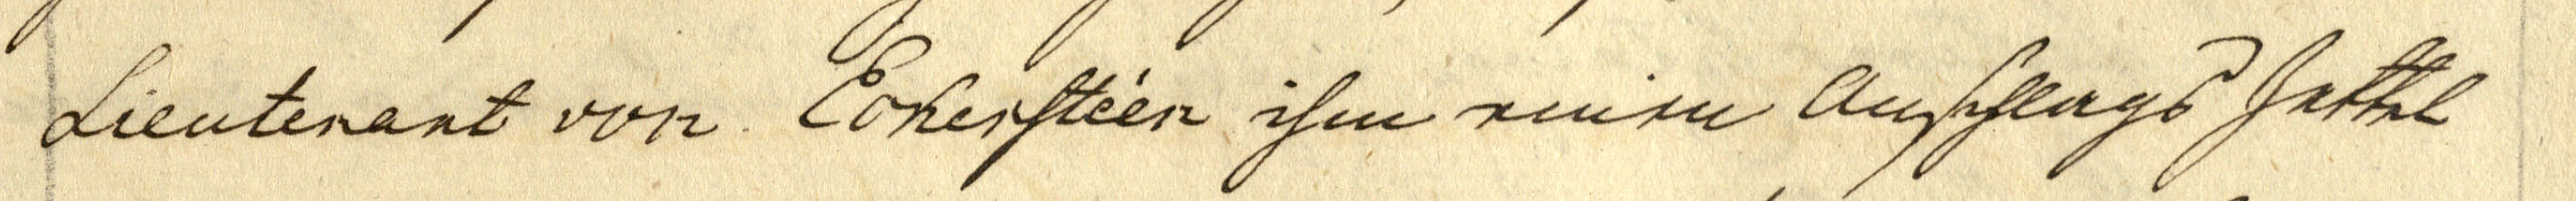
Lieutenant von Eckersteén ihm einen Anschlags Zettel
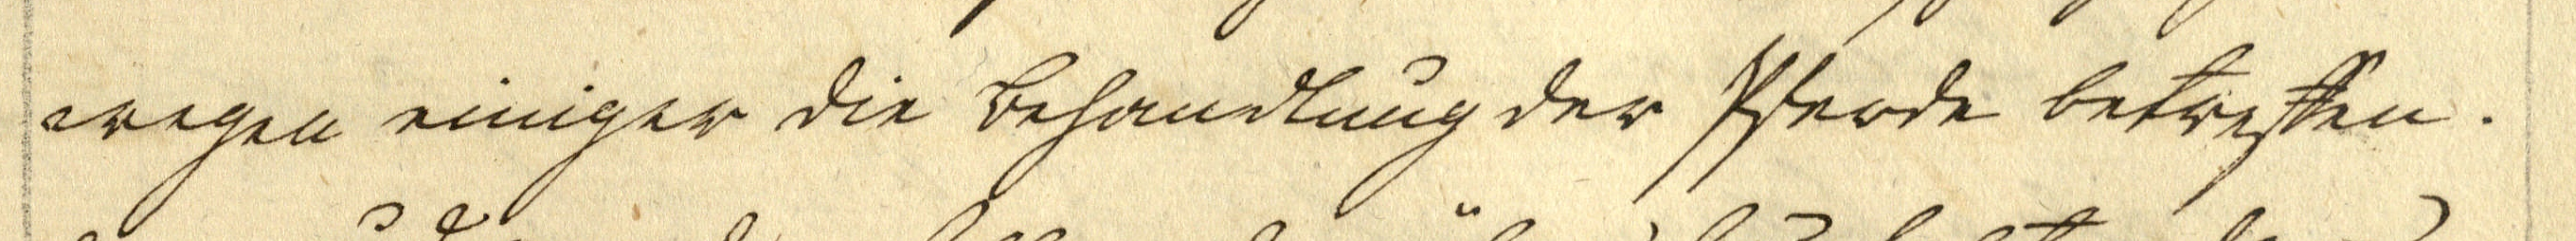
wegen einiger die Behandlung der Pferde betreffen-
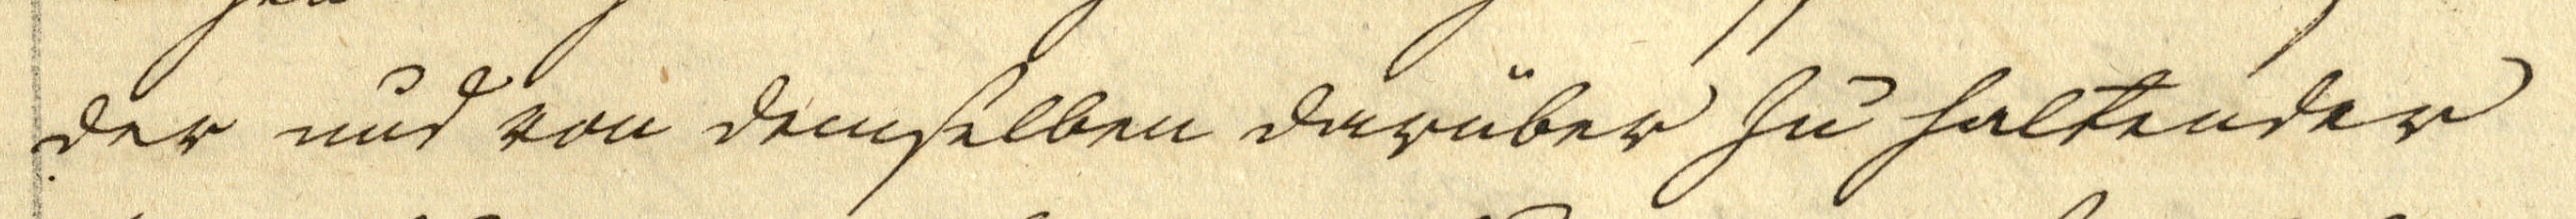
der und von demselben darüber zu haltender
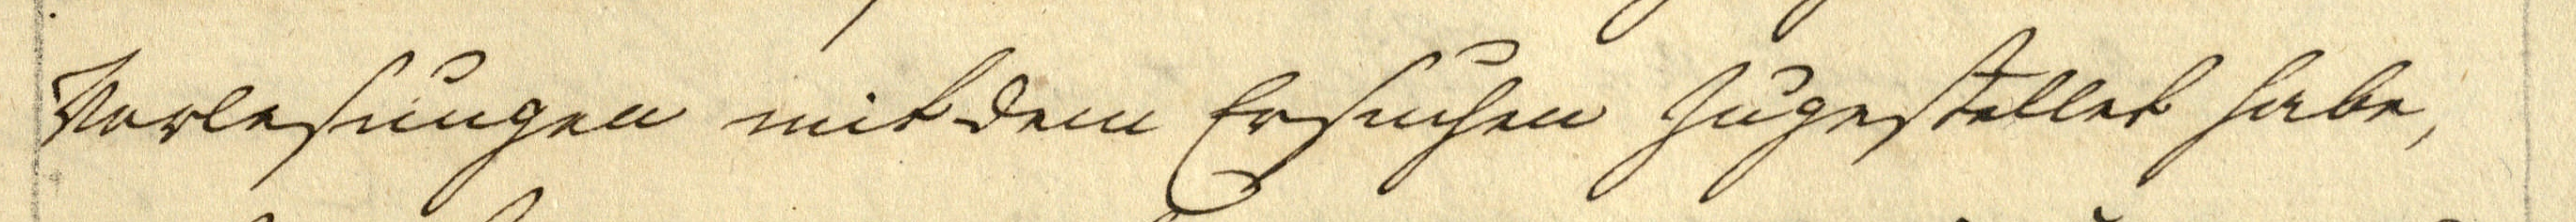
Vorlesungen mit dem Ersuchen zugestellet habe,
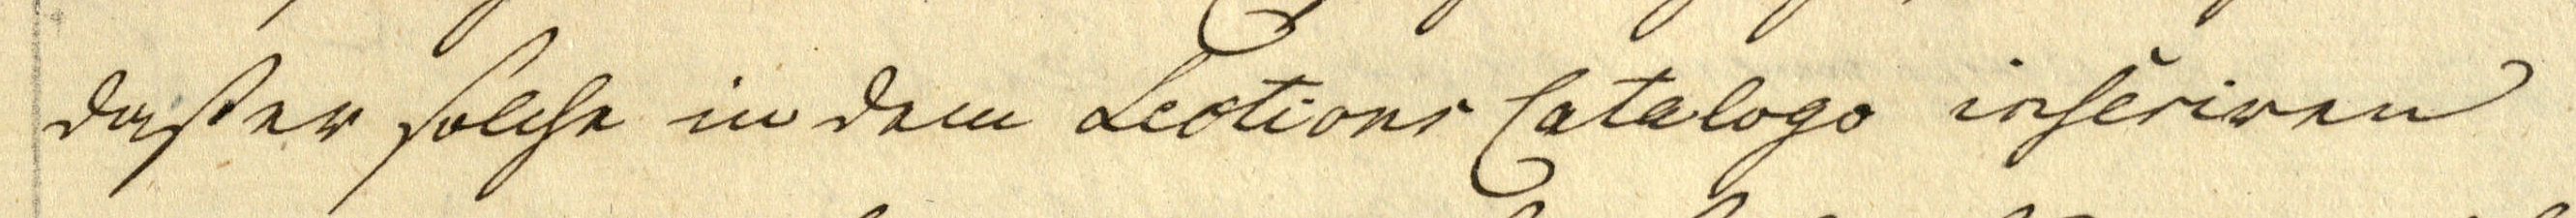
daß er solche in dem Lections Catalogo inseriren
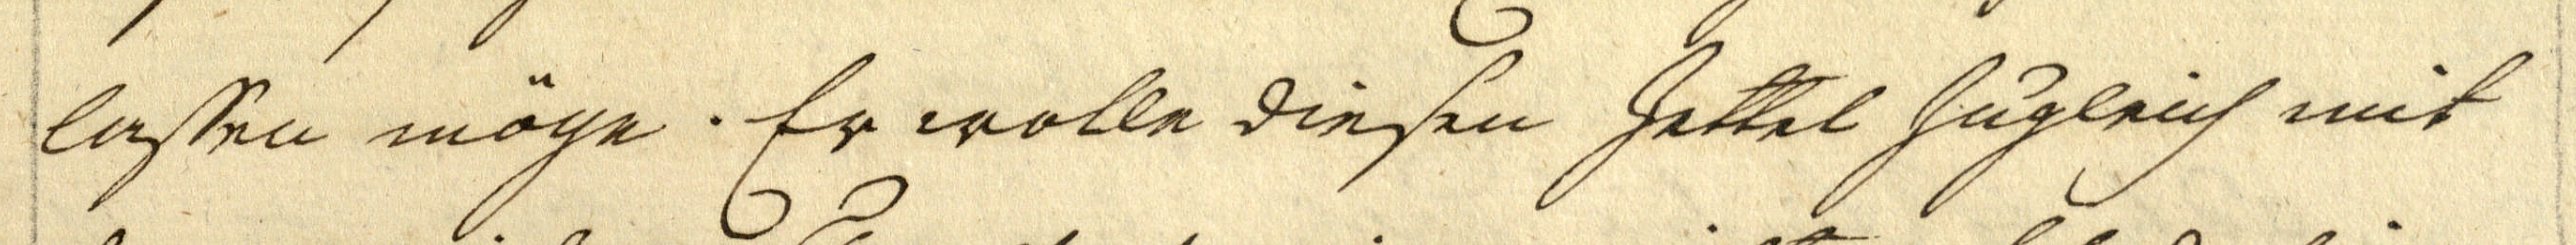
lassen möge. Er wolle diesen Zettel zugleich mit
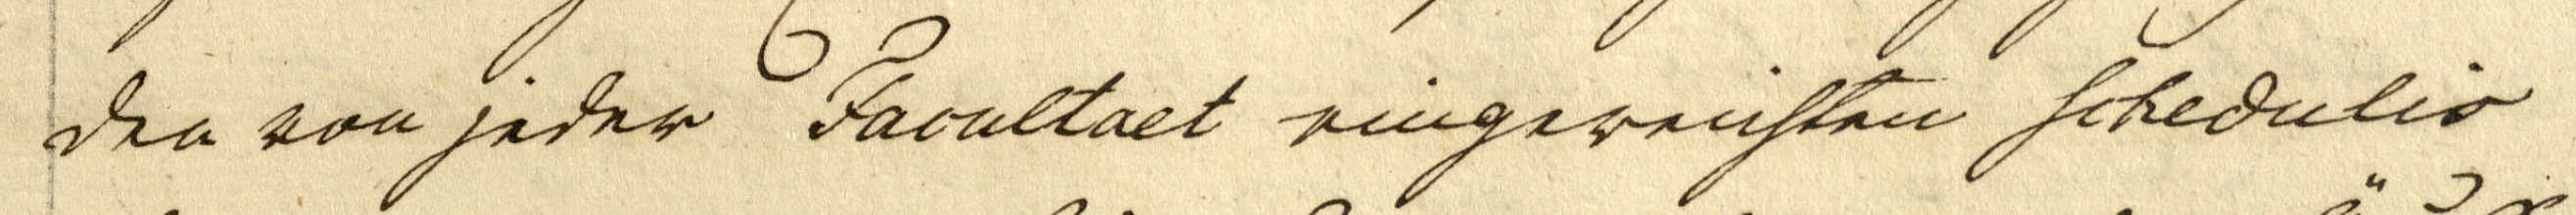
den von jeder Facultaet eingereichten Schedulis
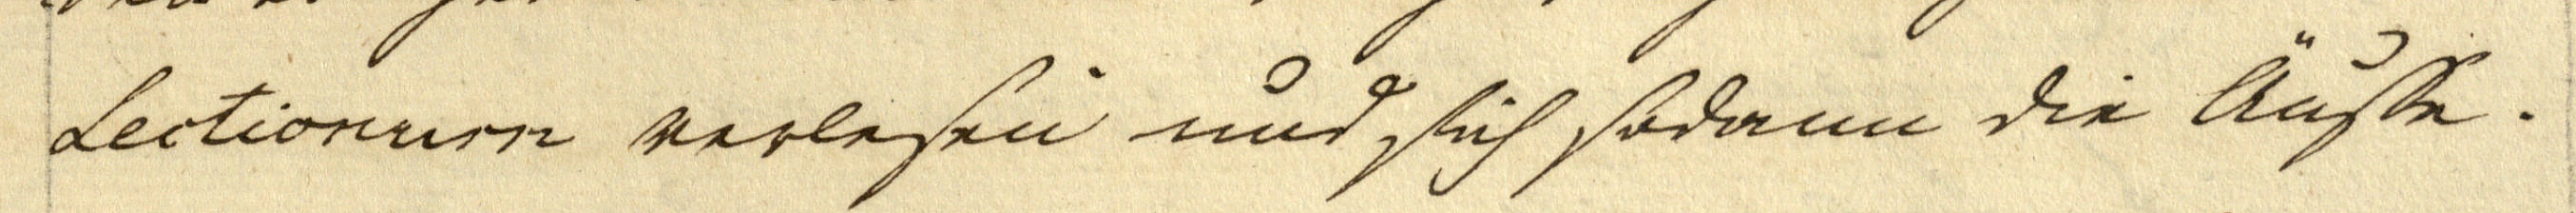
Lectionum verlesen und sich sodann die Äusse-
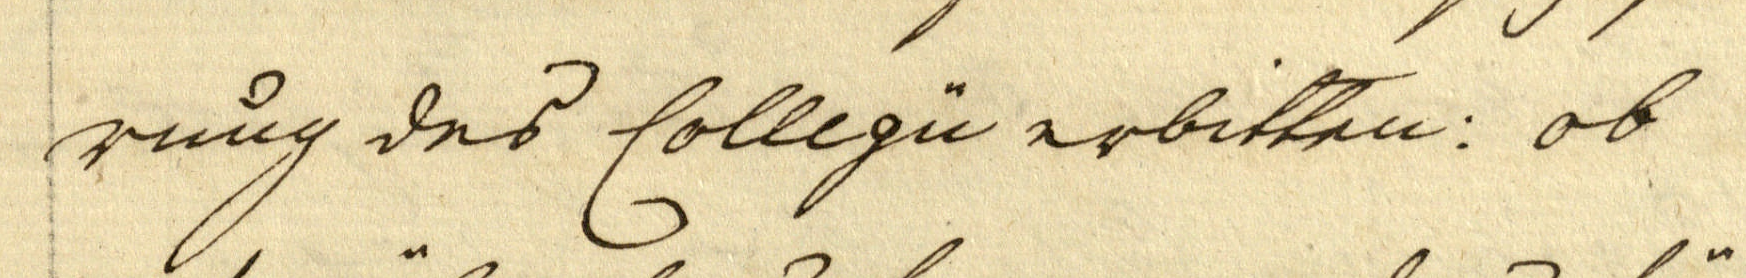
rung des Collegii erbitten: ob
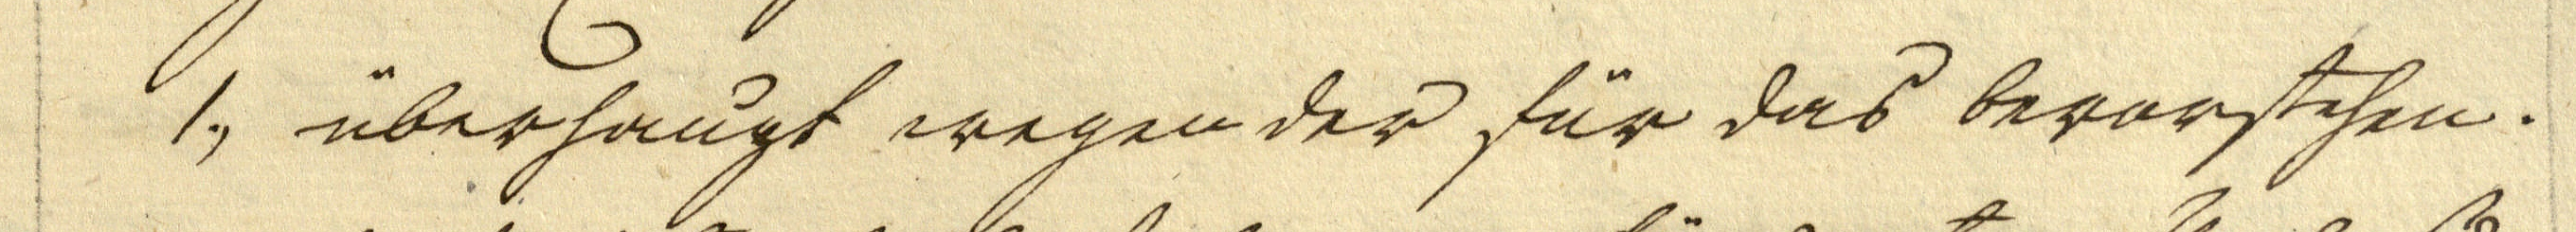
1., überhaupt wegen des für das bevorstehen-
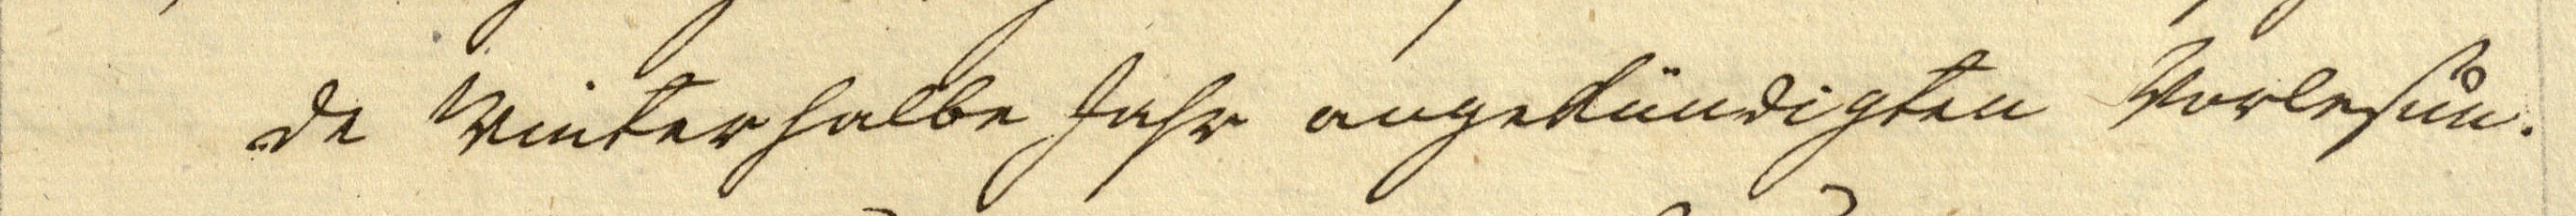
de Winterhalbe Jahr angekündigten Vorlesun-
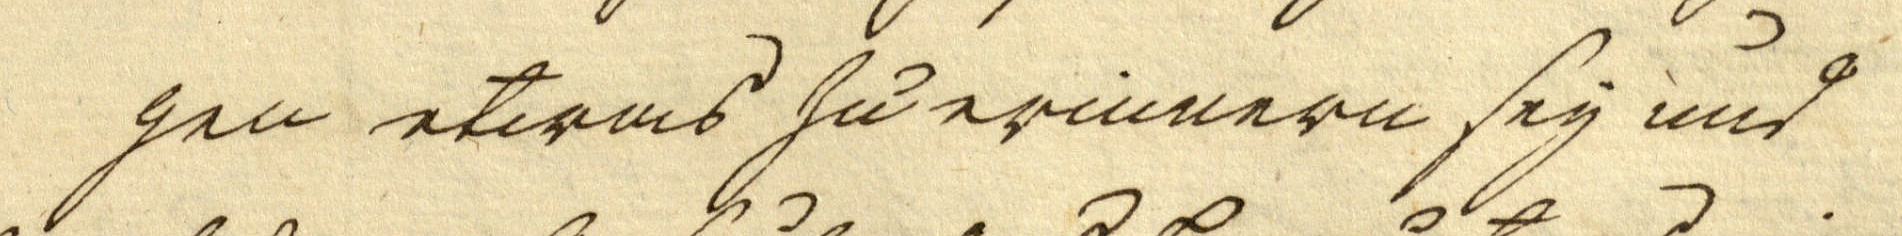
gen etwas zu erinnern sey und
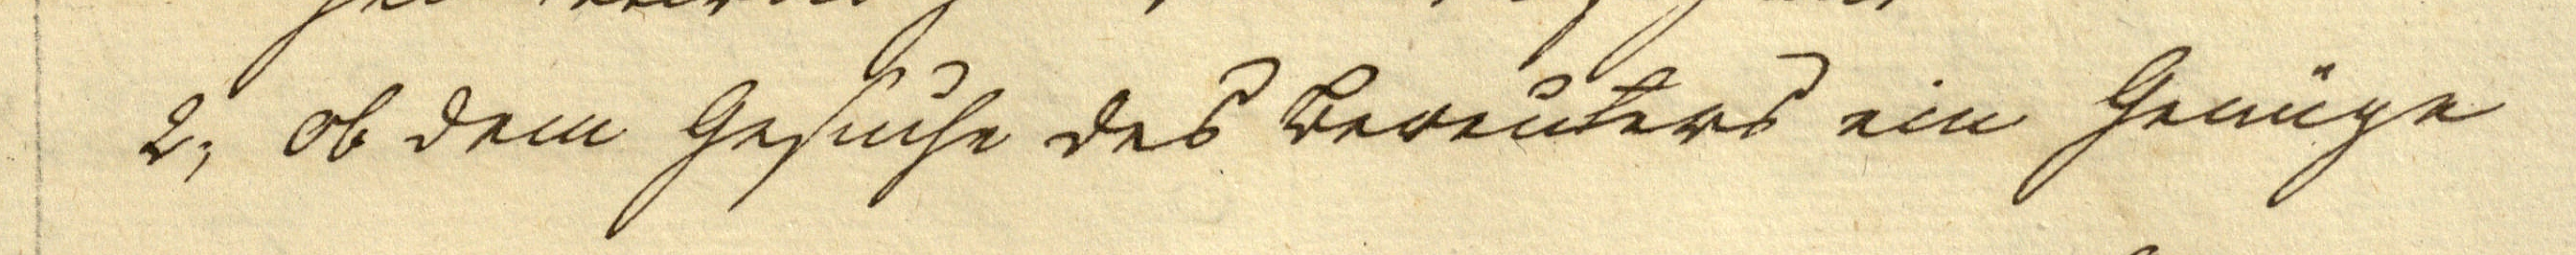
2., ob dem Gesuche des Bereuters ein Genüge
